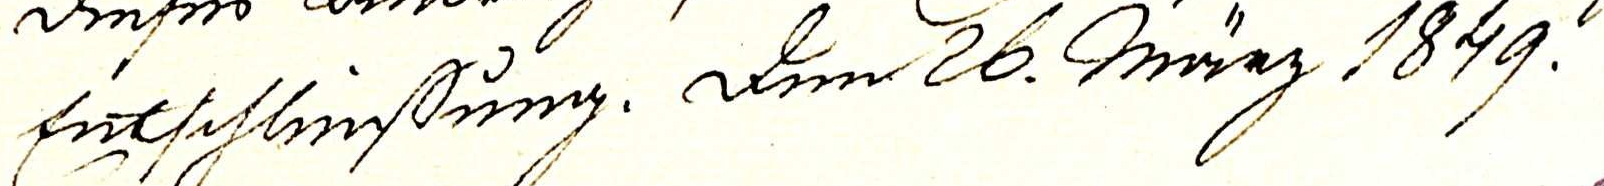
Entschließung. Den 26. März 1849.
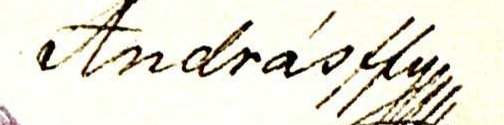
Andrásffy
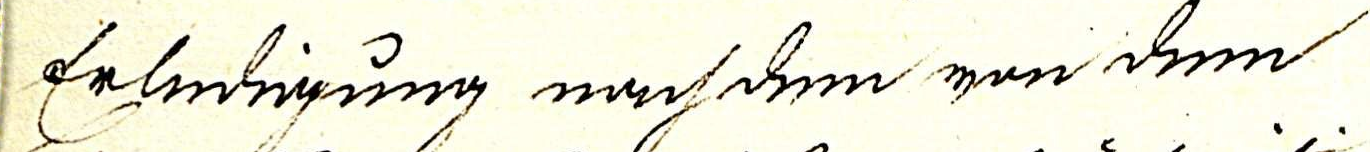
Erledigung nach dem von dem
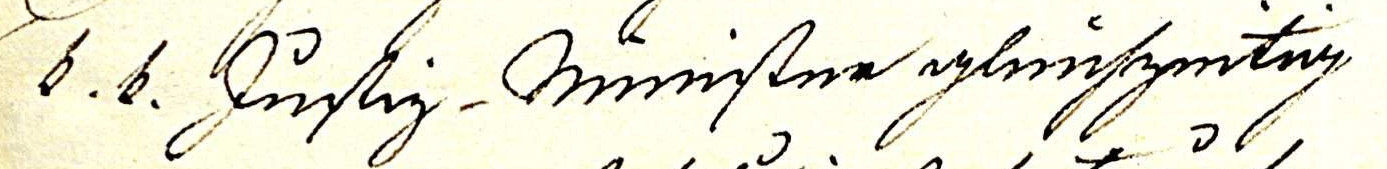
k.k. Justiz-Minister gleichzeitig
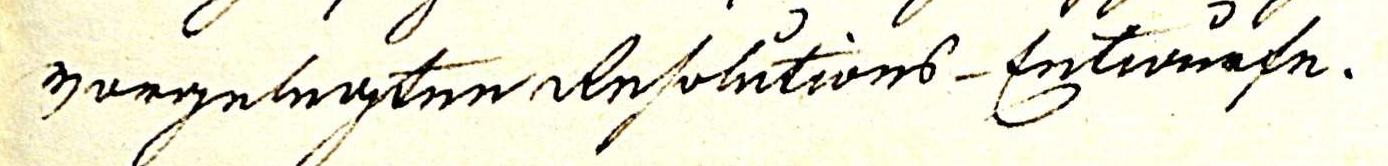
vorgelegten Resolutions-Entwurfe.
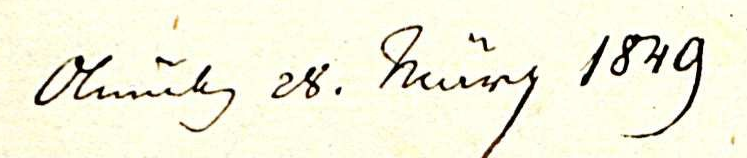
Olmütz, 28. März 1849
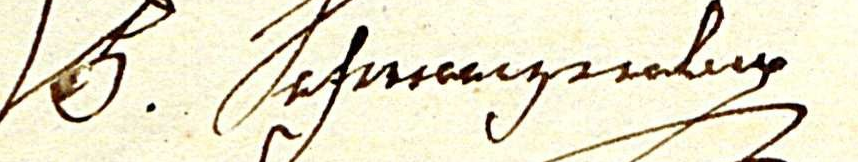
B. Schwarzenberg
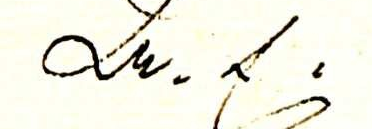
A. E.
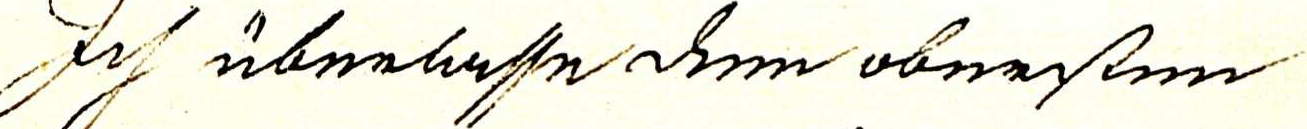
Ich überlasse dem obersten
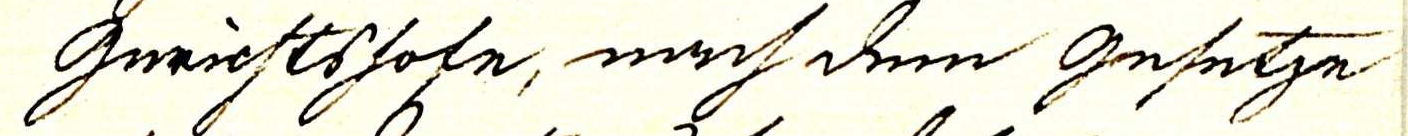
Gerichtshofe, nach dem Gesetze
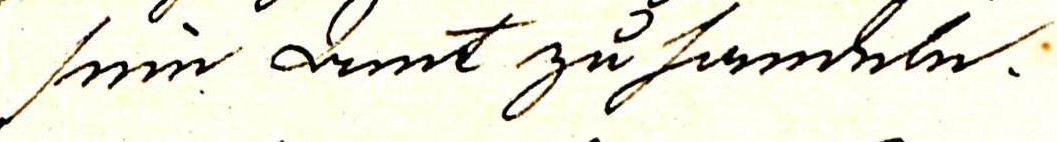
sein Amt zu handeln.
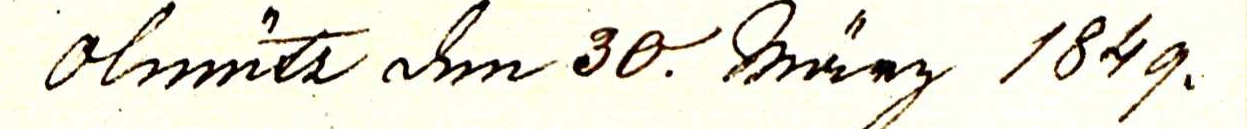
Olmütz den 30. März 1849
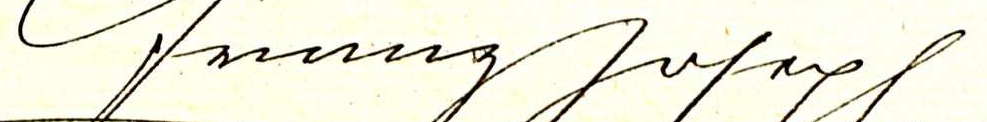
Franz Joseph
